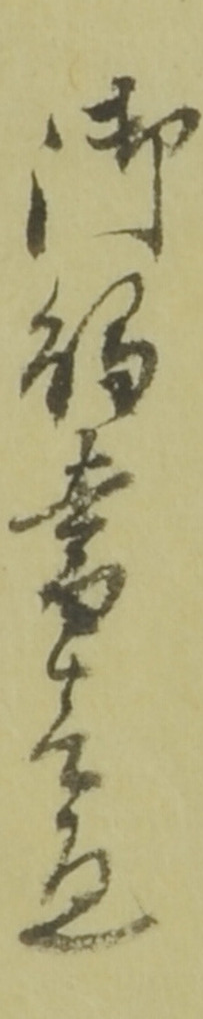御触書壱通
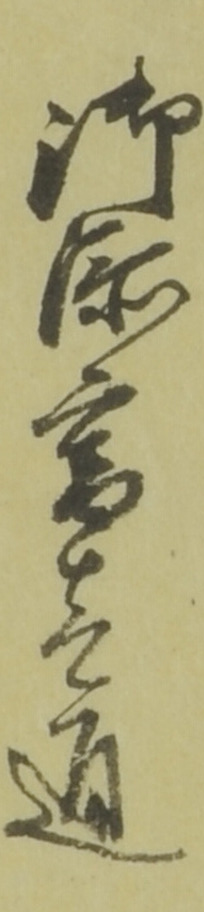御添書壱通
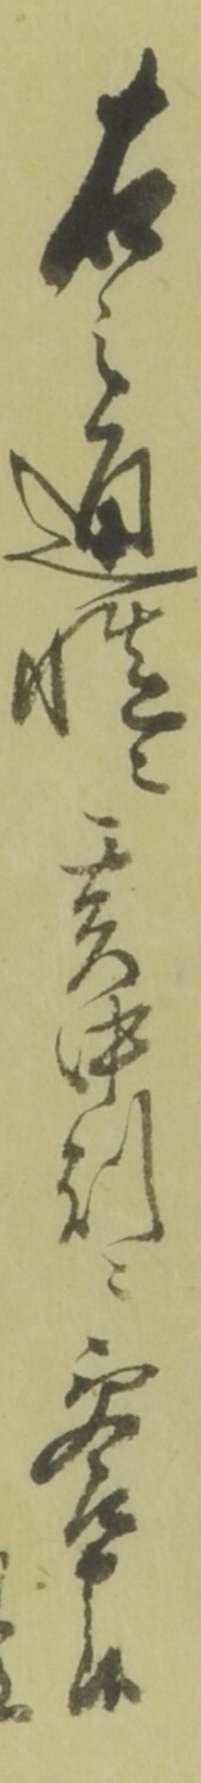右之通慥ニ亥中則ニ受取申候

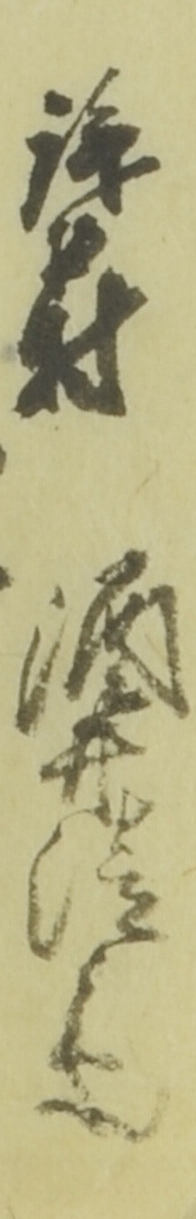鉾持村酒井清兵衛
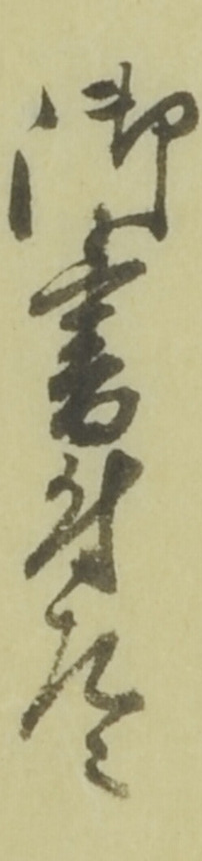御書付左ニ
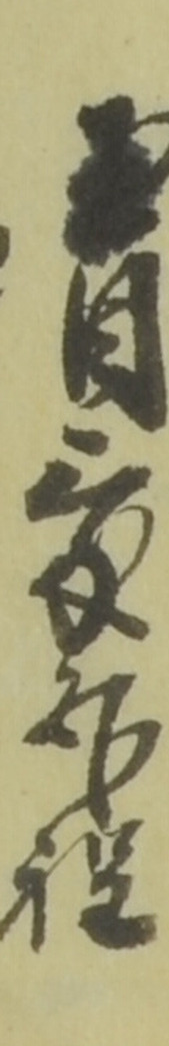玉目三匁五分程
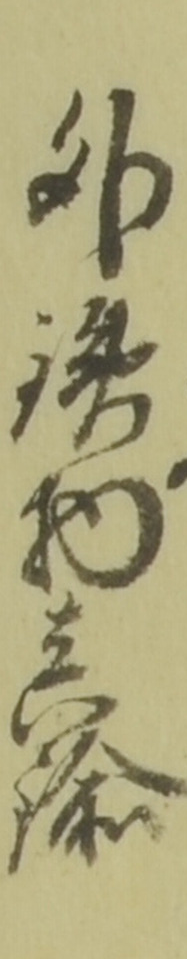外鉄物真鍮
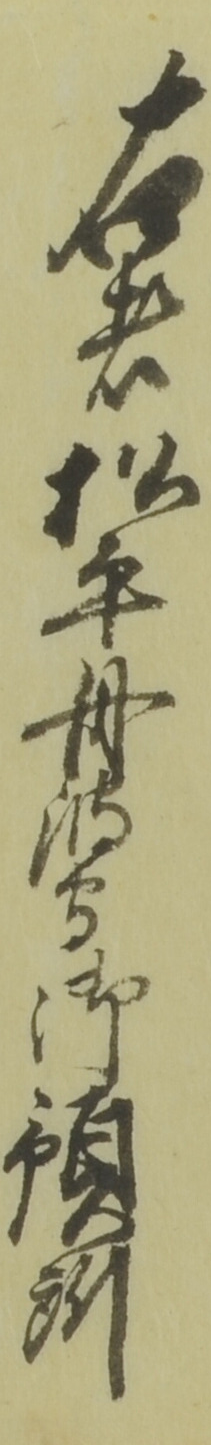右は松平丹波守御預所
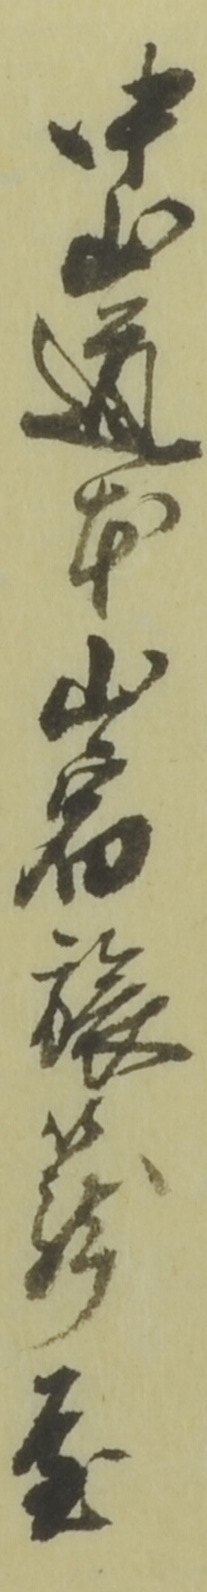中山道本山宿旅籠屋
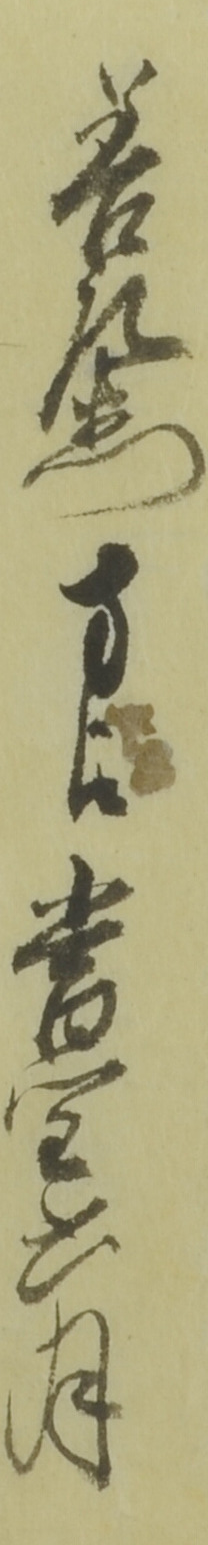善左衛門方江当閏六月
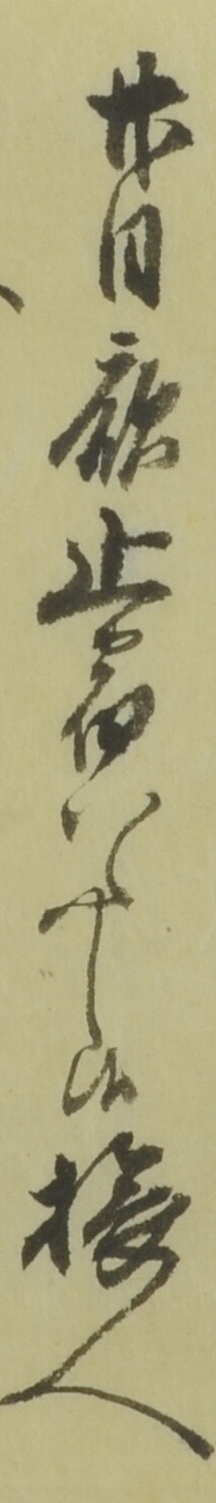廿日夜止宿いたし候拾人
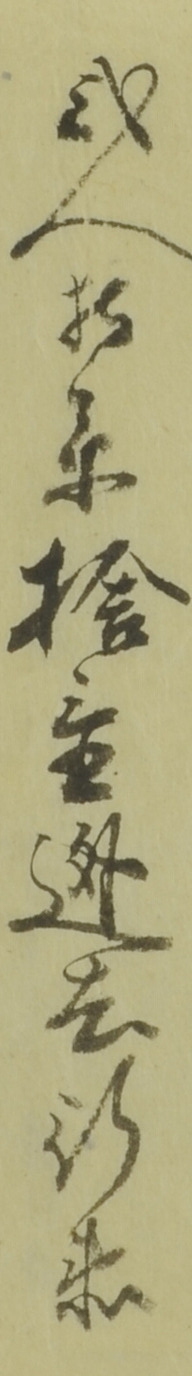弐人持参拾置逃去行衛
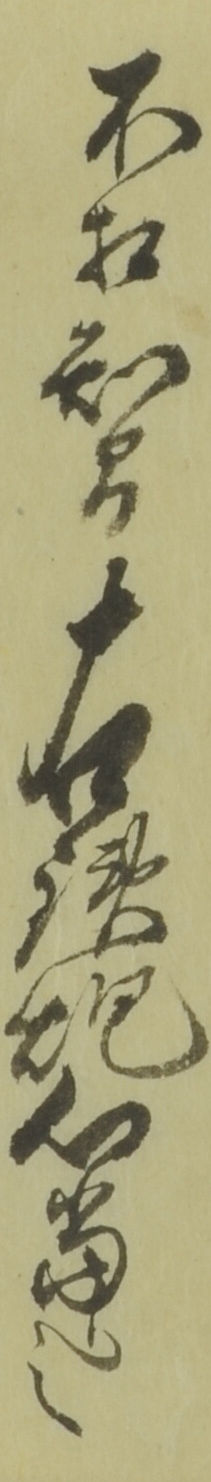不相知間右鉄砲心当り之
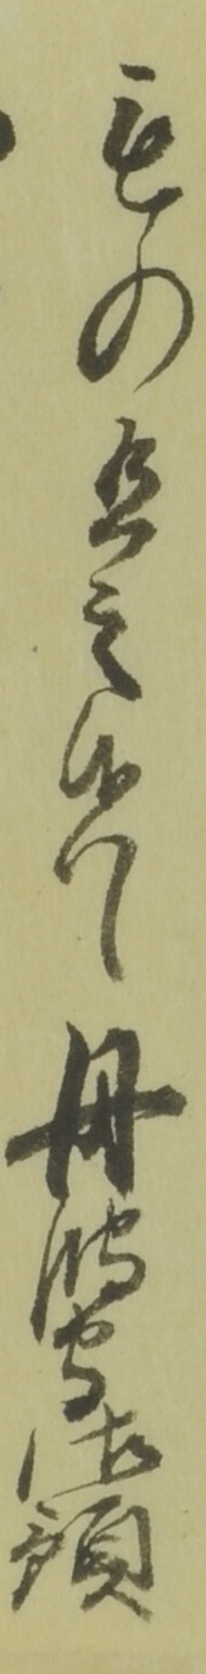もの有之候ハヽ丹波守御預
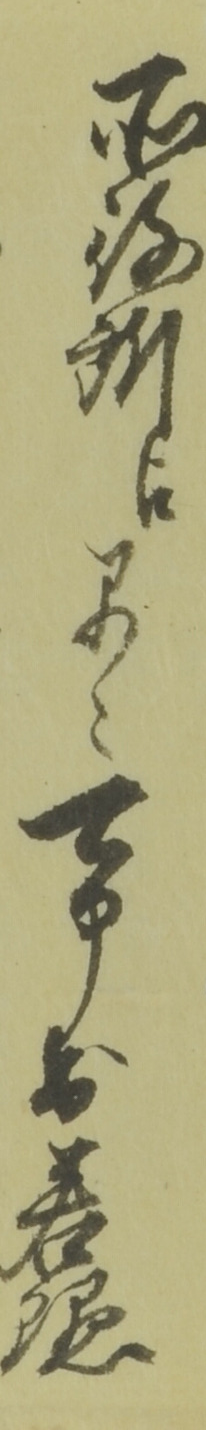所役所江草々可申出若隠
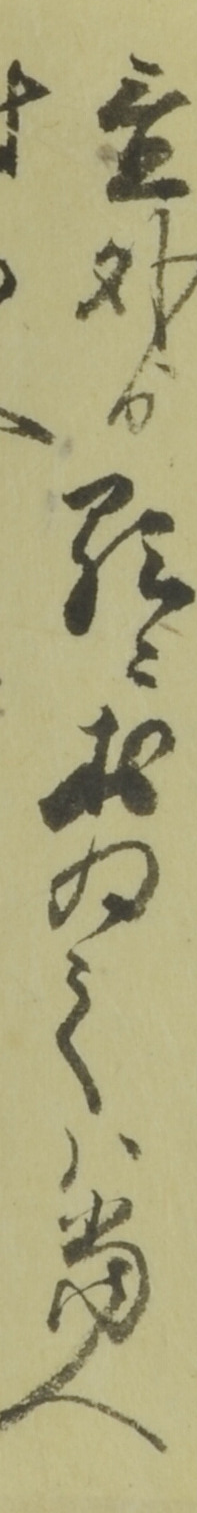置外ゟ顕ニおゐてハ当人
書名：御触書御書附控
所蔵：伊那市立高遠町図書館・合同会社AMANE
